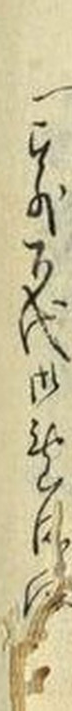其外下代御台所向
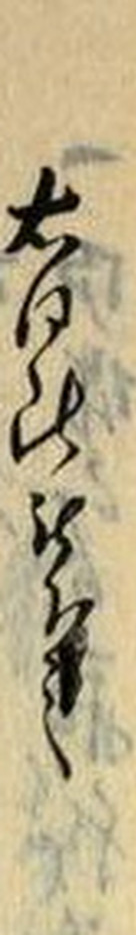右同断被下之
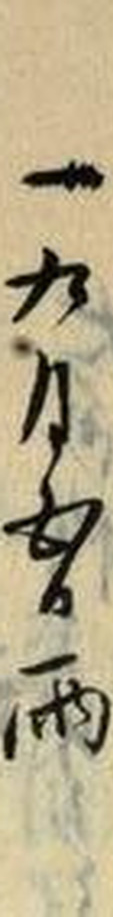一九月五日雨
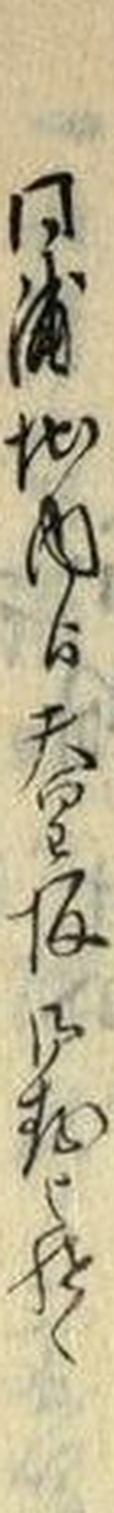同浦地内ゟ天皇坂御越被遊候
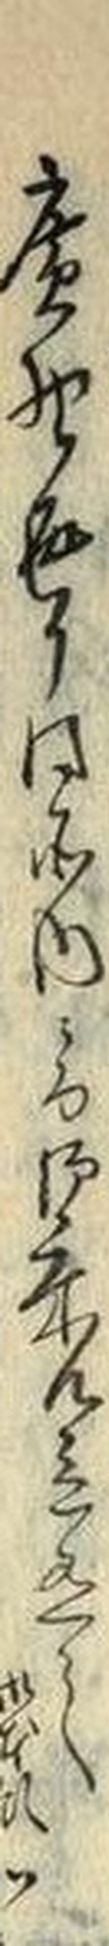広野通り同所内ニ而御床几立有之
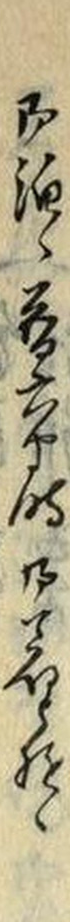御泊へ暮六半時御着被遊候

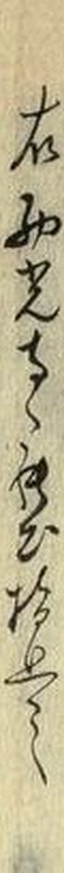右西光寺へ罷出指上之
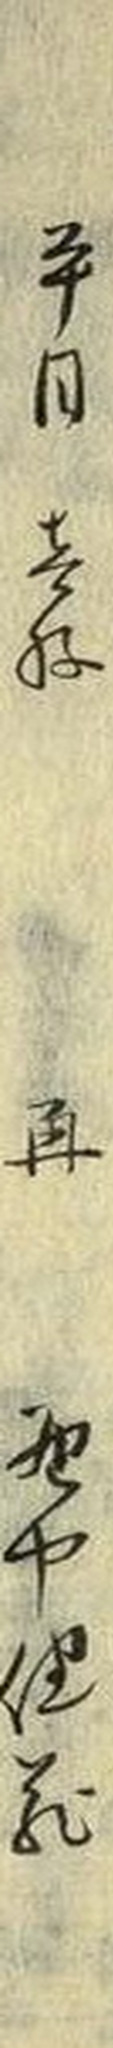平目壱枚再野中健蔵
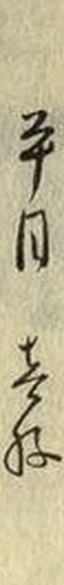平目壱枚
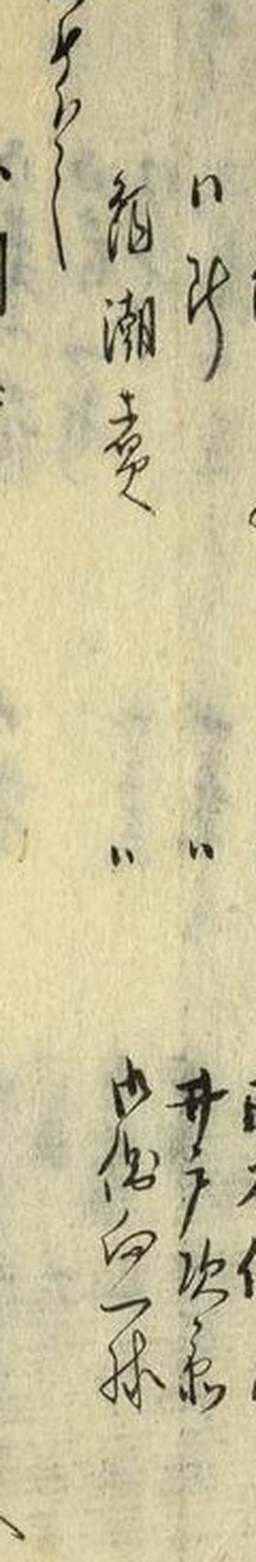鯛潮煮同御側向一統
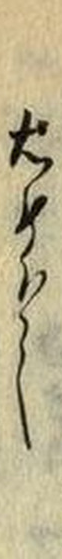右被下之
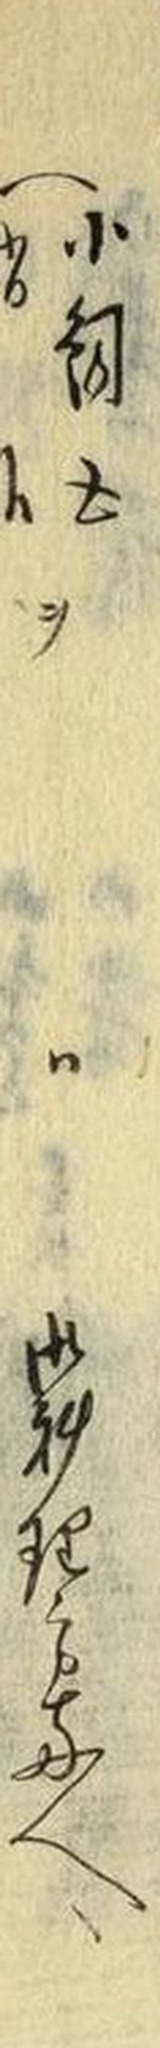蛸弐ヲ同御料理方両人へ
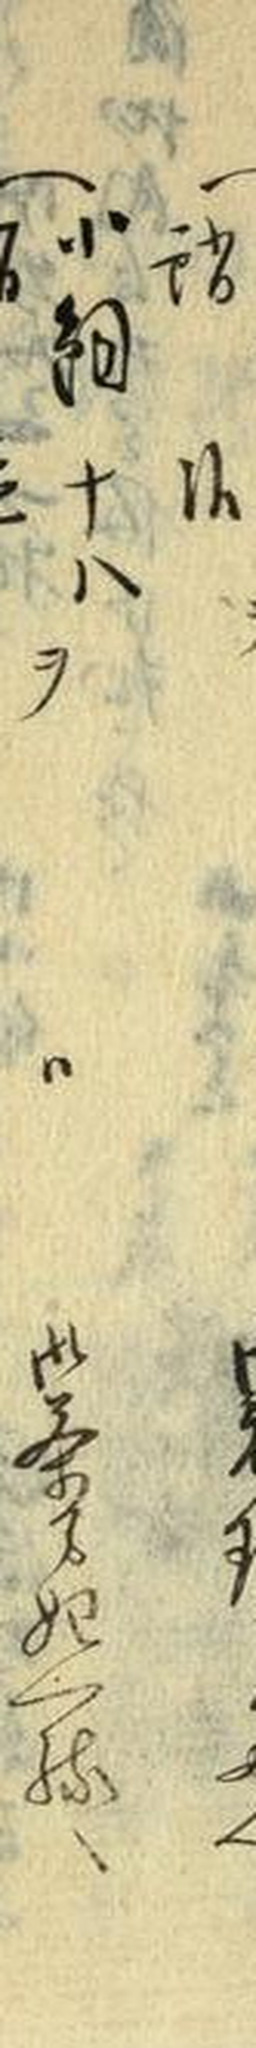蛸壱ヲ同御茶方始一統へ
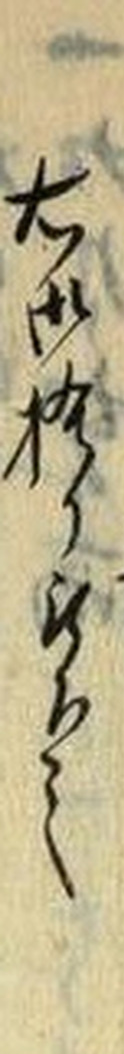右御捨り被下之
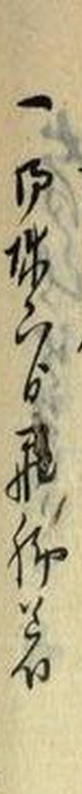一御城下ゟ飛脚着
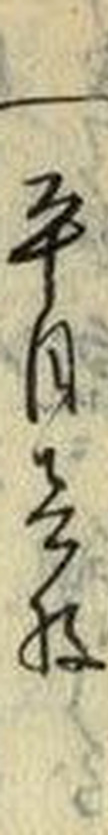平目壱枚
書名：少傅日録抄（斉承付側向頭取日記、在国）
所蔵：福井県文書館 Fukui Prefectural Archives
